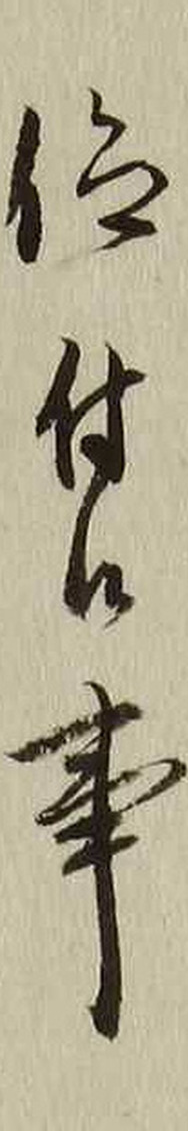仰付候事
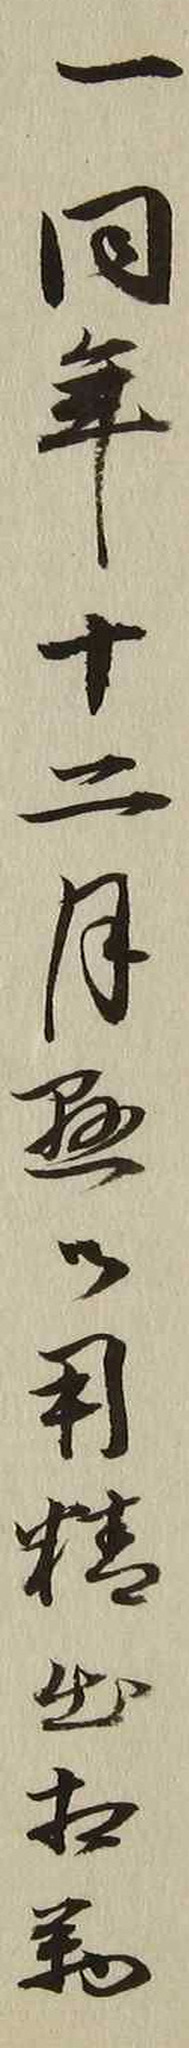一同年十二月懸御用精出相勤
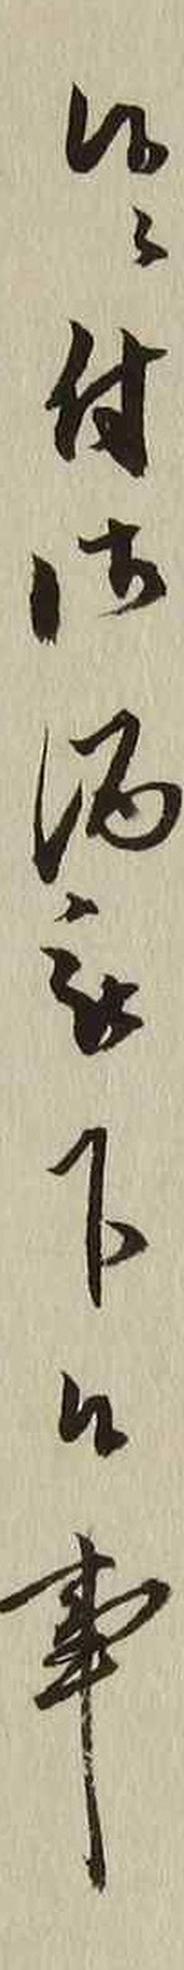候ニ付御酒被下候事
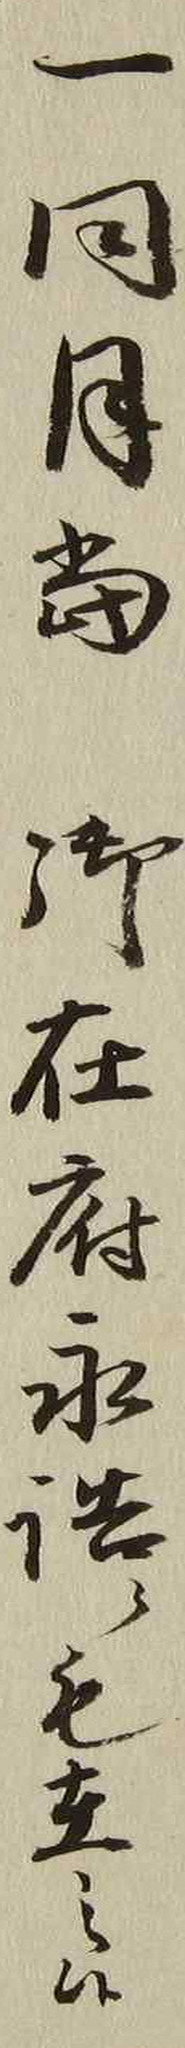一同月当御在府永詰ニも在之候
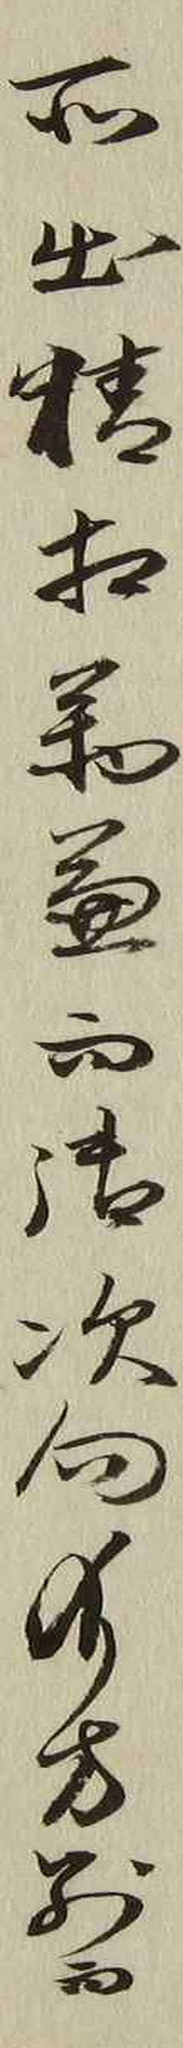所出精相勤兼而御次向〆り方別而
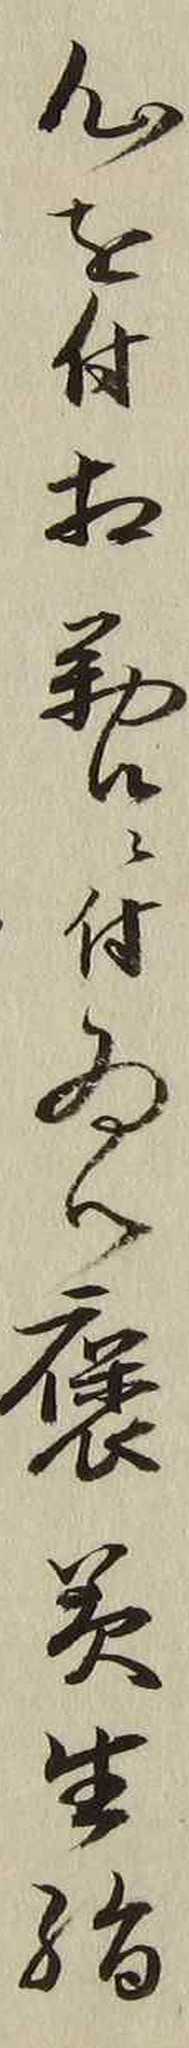心を付相勤候ニ付為御褒美生絹
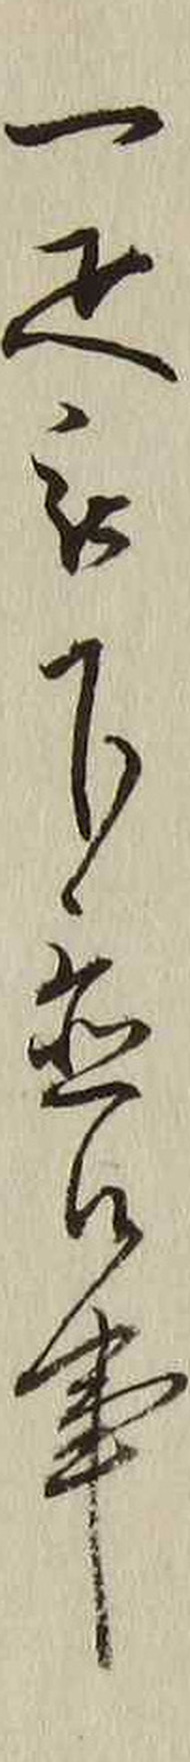一疋被下置候事
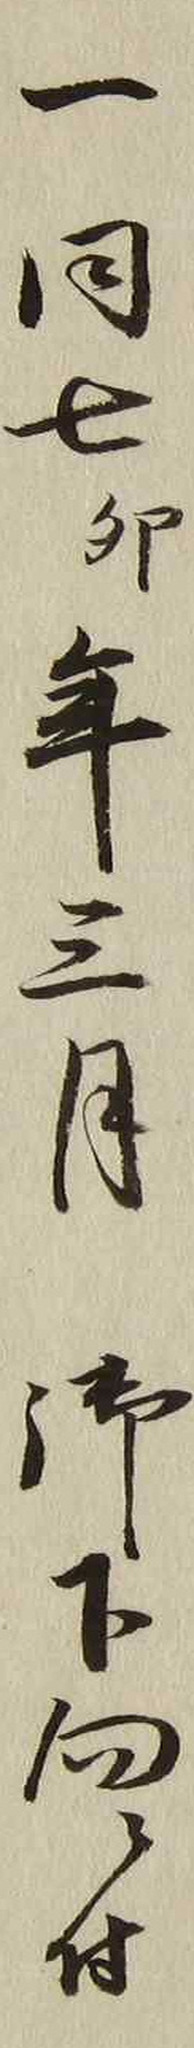一同七卯年三月御下向ニ付
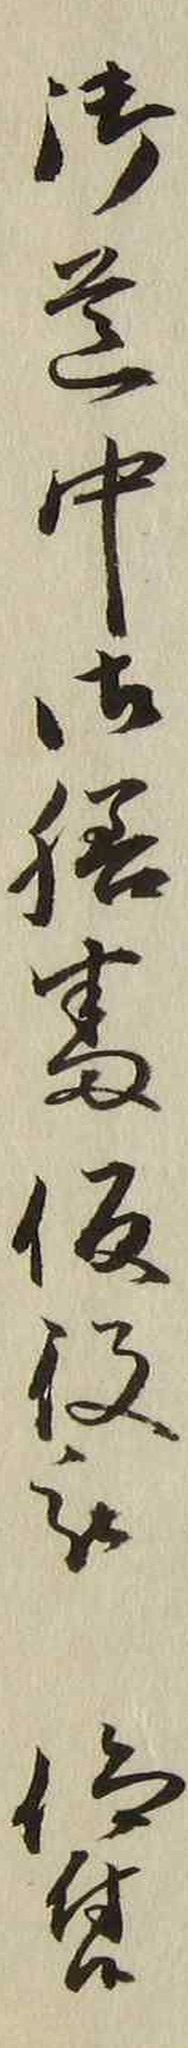御道中御膳番仮役被仰付候
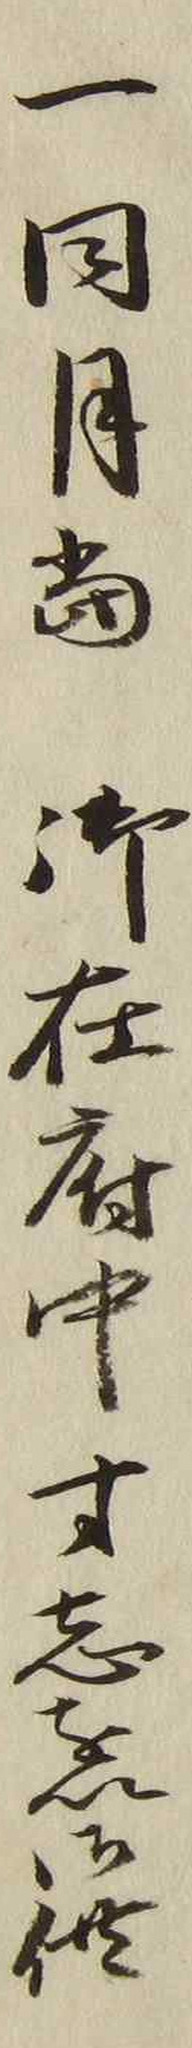一同月当御在府中寸志を以御供

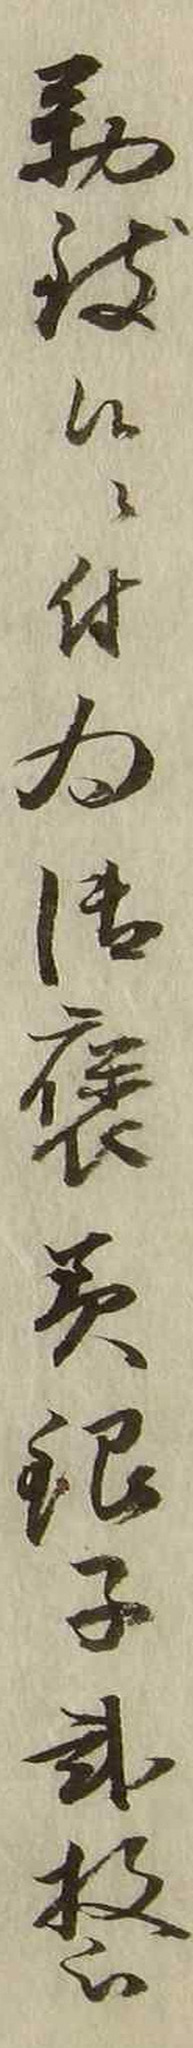勤致候ニ付為御褒美銀子弐枚被
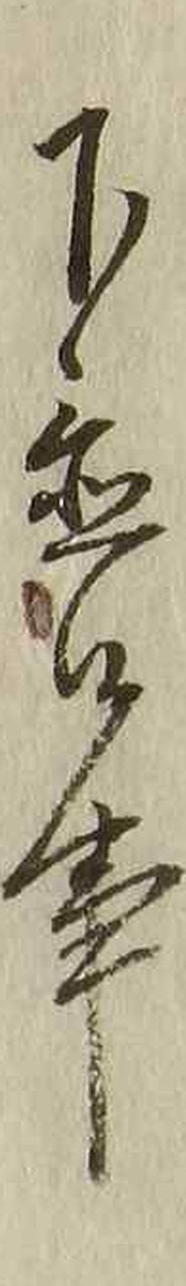下置候事
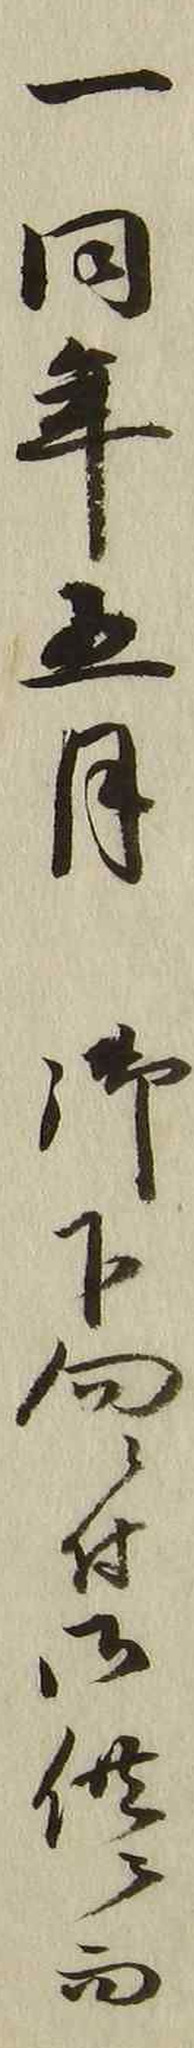一同年五月御下向ニ付御供ニ而
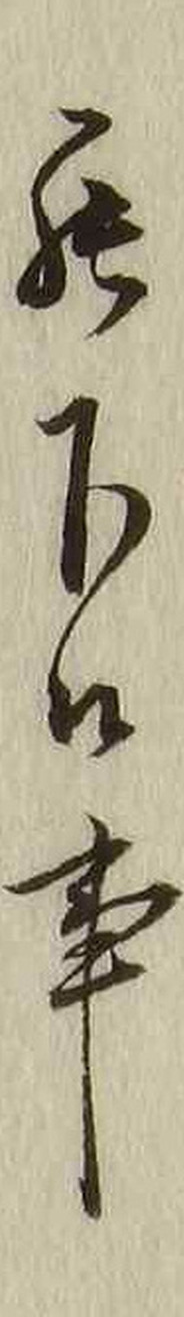罷下候事
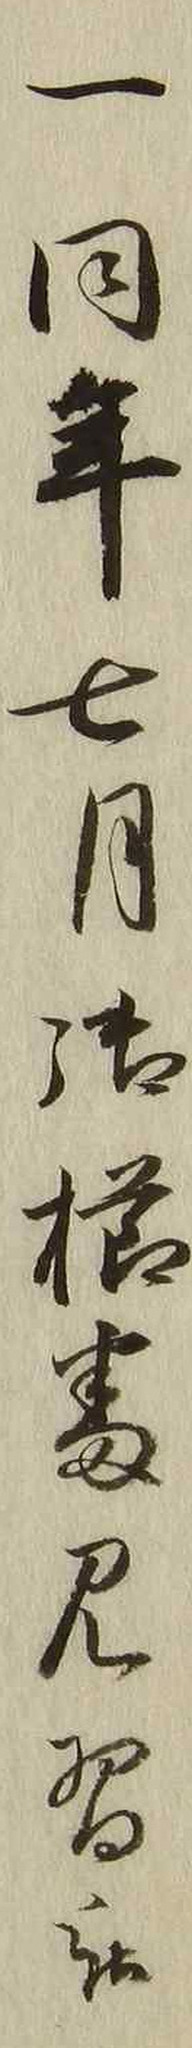一同年七月御櫛番見習被
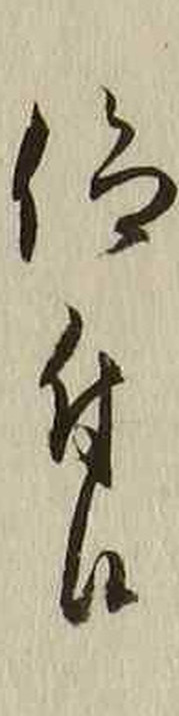仰付候
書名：諸士系譜　巻之61　と之部4
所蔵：会津若松市立会津図書館
